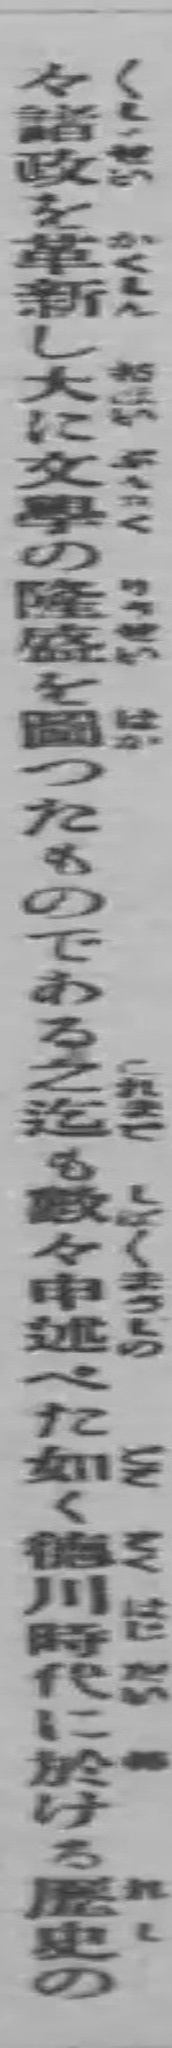着諸政を革新し大に文学の隆盛を図つたものである之迄数々申述べた如く徳川時代に於ける歴史の
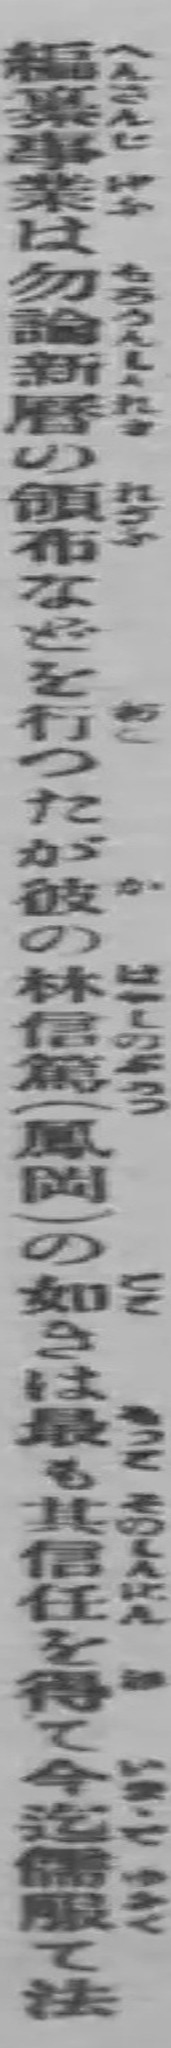編纂事業は勿論新暦の領布などを行つたが彼の林信篤(鳳岡)の如きは最も其信任を得て今迄儒服て法
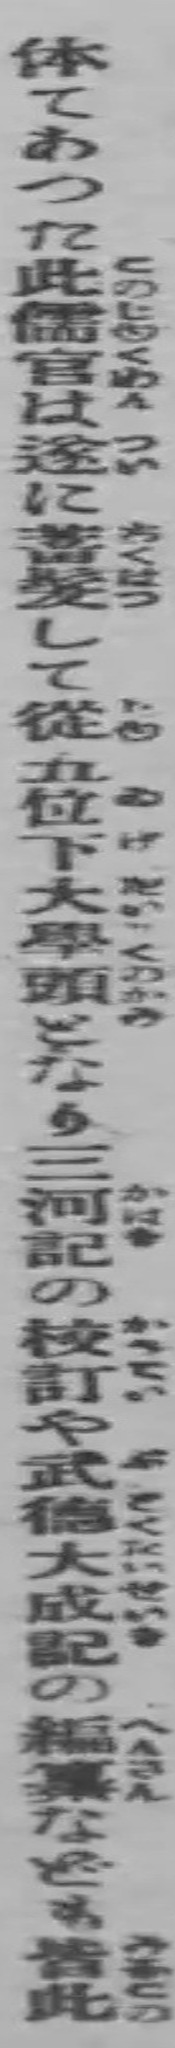体てあつた此儒官は遂に蓄髪して従五位下大学頭となり三河記の校訂や武徳大成記の編纂なども皆此
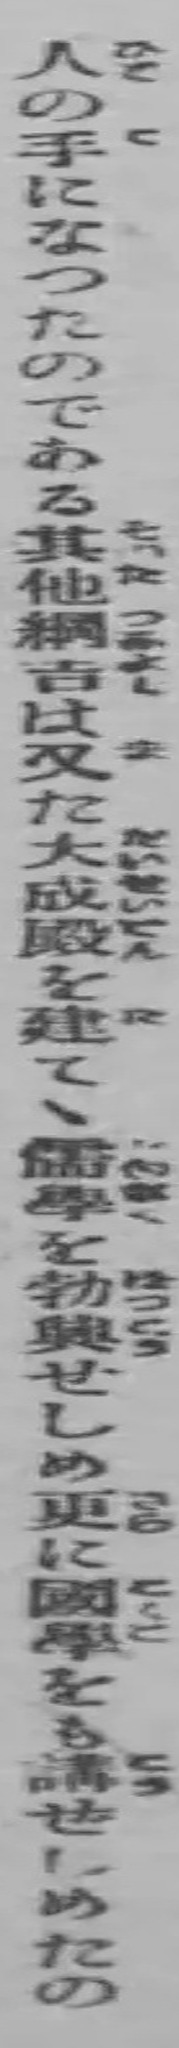人の手になつたのである其他綱吉は又た大成殿を建てゝ儒学を勃興せしめ更に国学をも講ぜしめたの
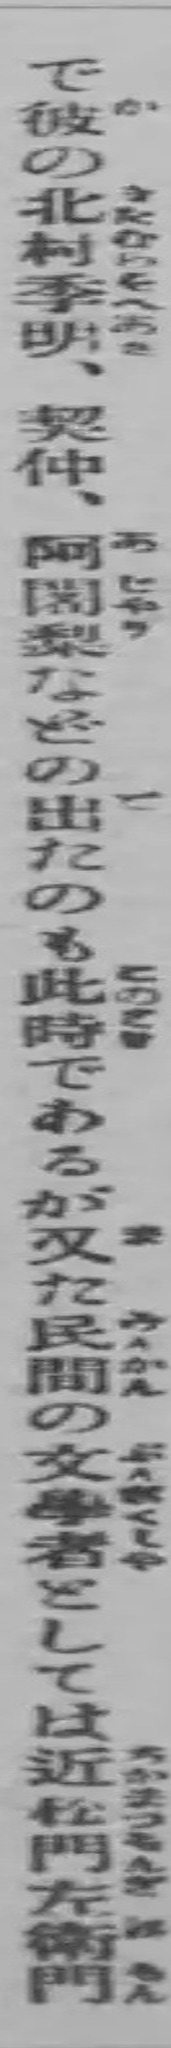で彼の北村季明、契仲、阿閣梨などの出たのも此時であるが又た民間の文学者としては近松門左衛門
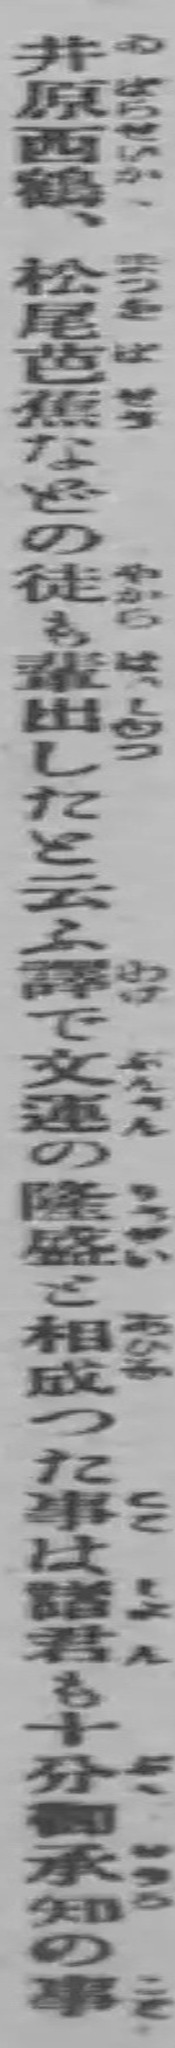井原西鶴、松尾芭蕉などの徒も輩出したと云ふ訳で文運の隆盛と相成つた事は諸君も十分御承知の事
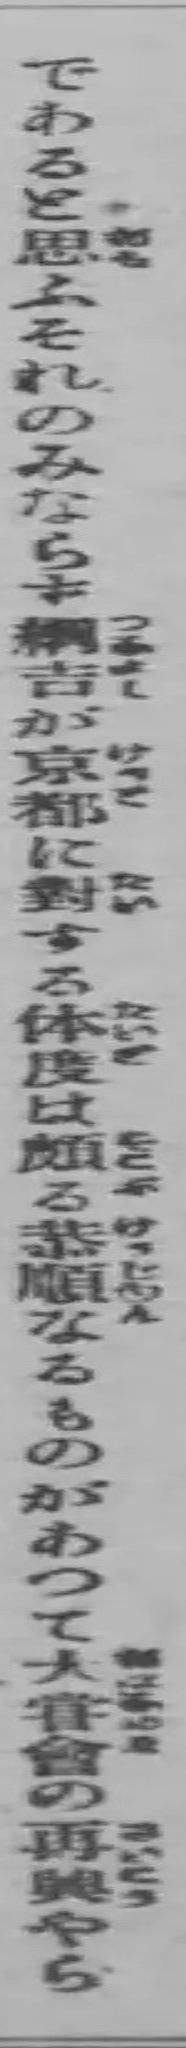であると思ふそれのみならず綱吉が京都に対する体度は頗る恭順なるものがあつて大嘗会の再興やら
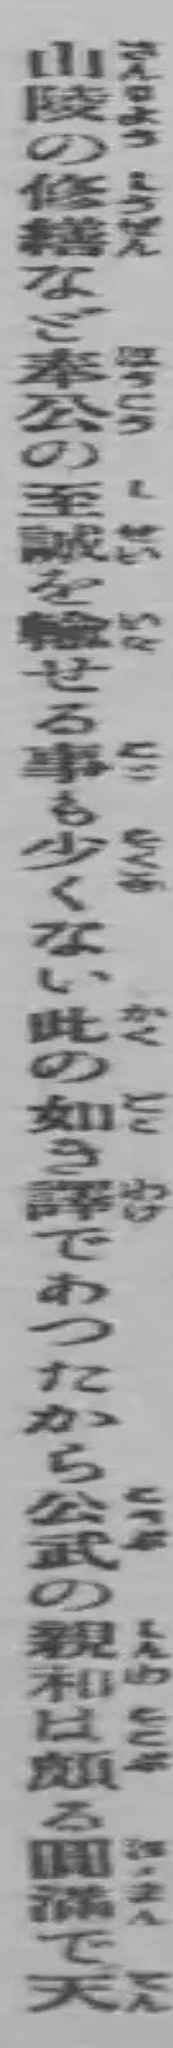山陵の修繕など奉公の至誠を輸せる事も少くない此の如き訳であつたから公武の親和は頗る円満で天
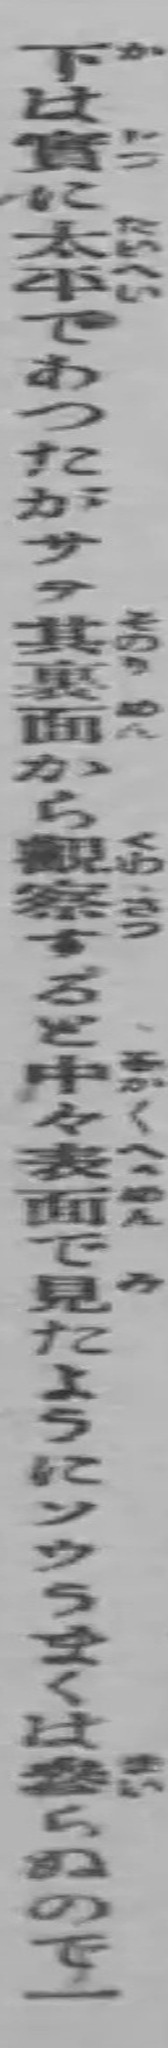下は実に太平であつたがサテ其裏面から観察すると中々表面で見たようにソウうまくは参らぬので一
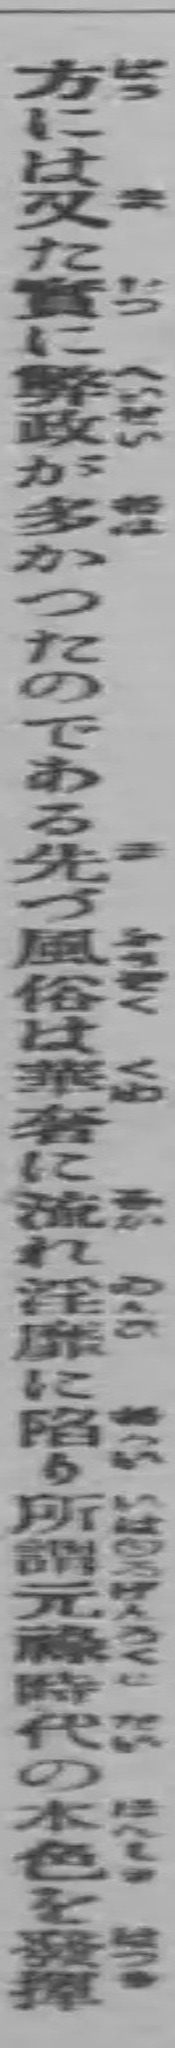方には又た実に弊政が多かつたのである先づ風俗は華奢に流れ淫靡に陥り所謂元禄時代の本色を発揮

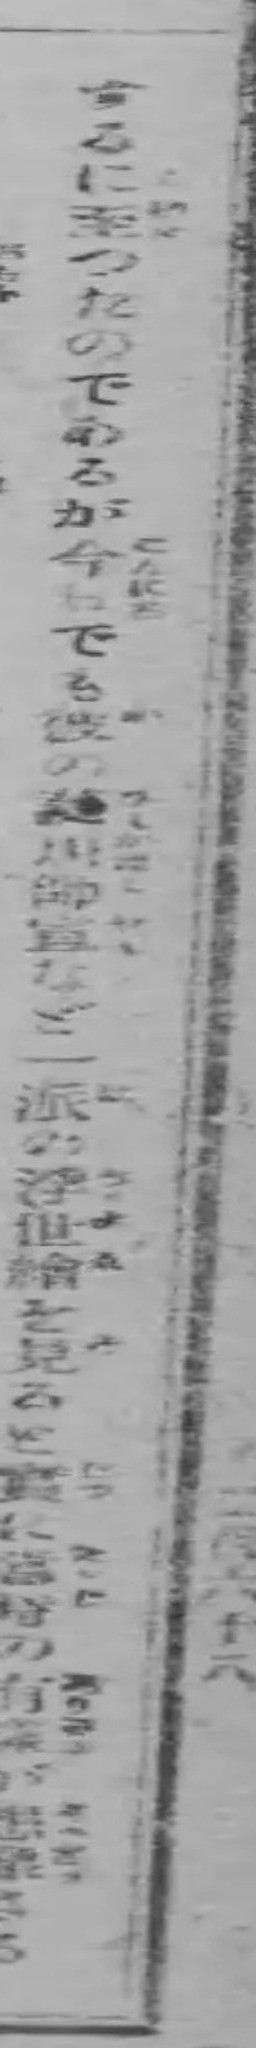するに至つたのであるが今日でも彼の菱川師宣など一派の浮世絵を見ると実に当時の有様が想像さる
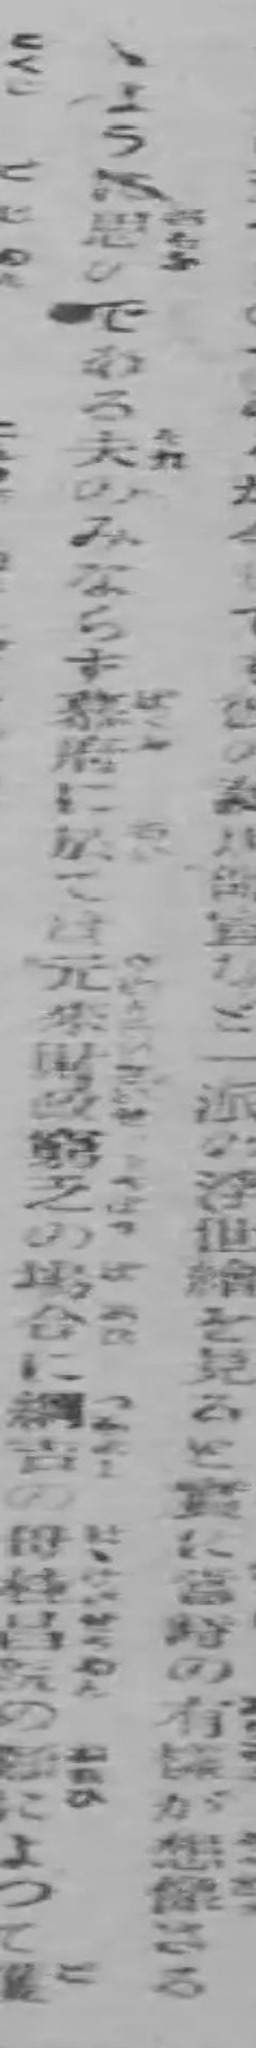ゝように思のである夫のみならず幕府に於ては元来財政窮乏の場合に綱吉の母桂昌院の願によつて護
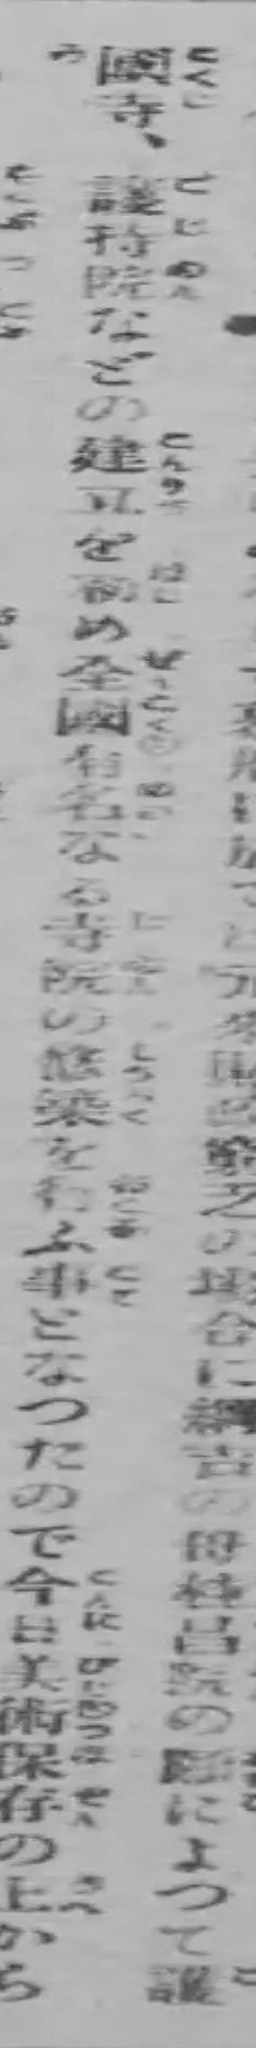国寺、護持院などの建立を初め全国有名なる寺院の修築を行ふ事となつたので今日美術保存の上から
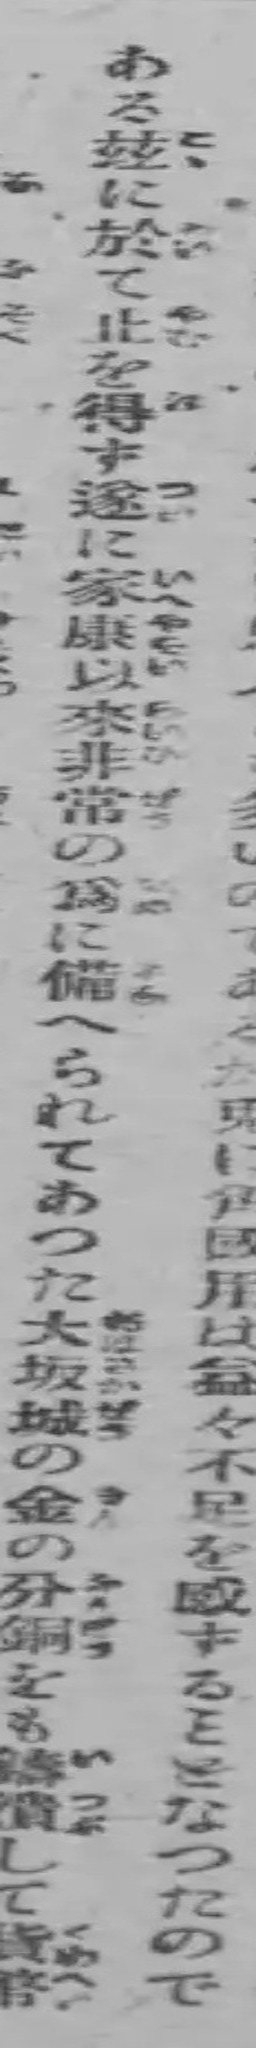ある茲に於て止を得ず遂に家康以来非常の為に備へられてあつた大坂城の金の分銅をも鋳潰して貨幣
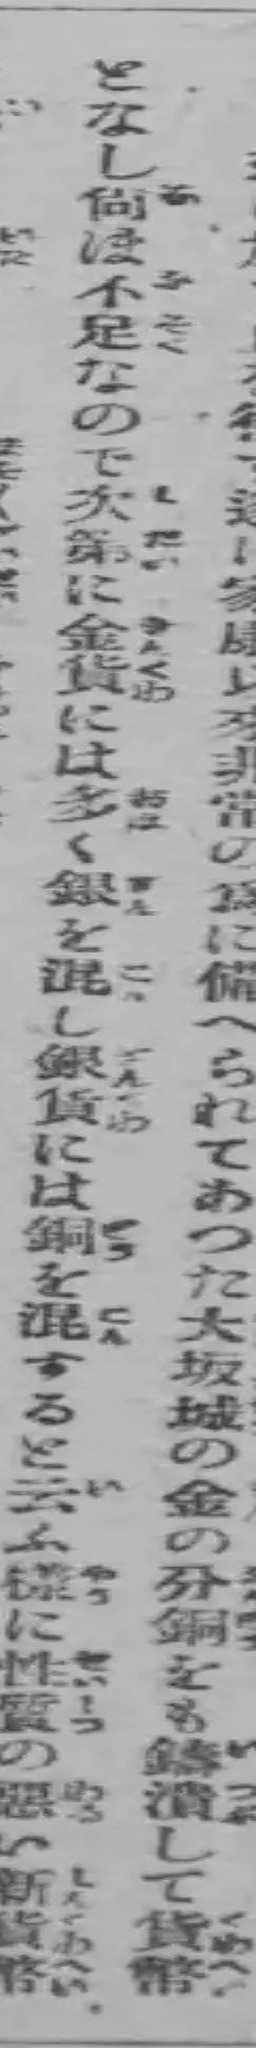となし尚ほ不足なので次第に金貨には多く銀を混し銀貨には銅を混すると云ふ様に性質の悪い新貨幣
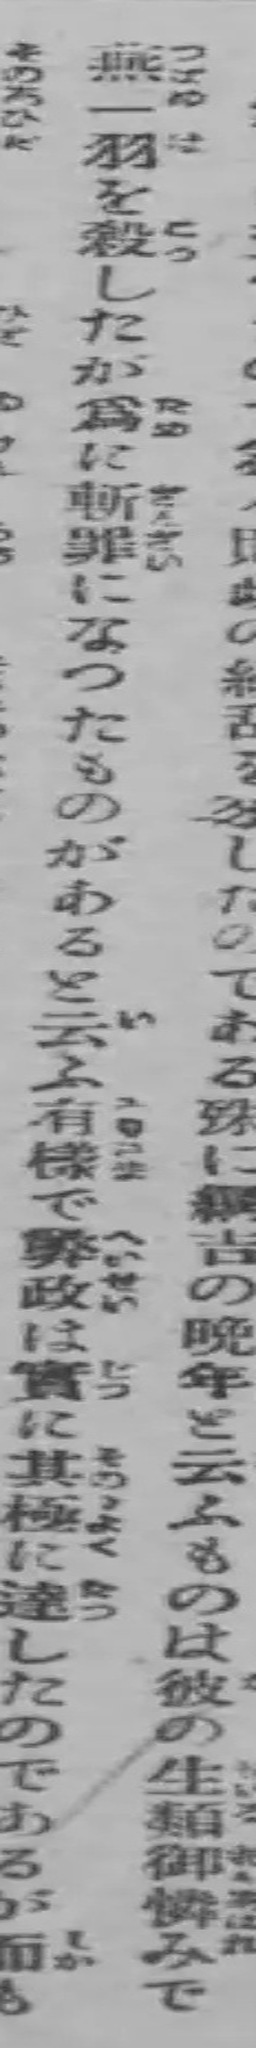燕一羽を殺したが為に斬罪になつたものがあると云ふ有様で弊政は実に其極に達したのであるが而も
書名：豊橋市史談
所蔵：国立国会図書館 National Diet Library, JAPAN
